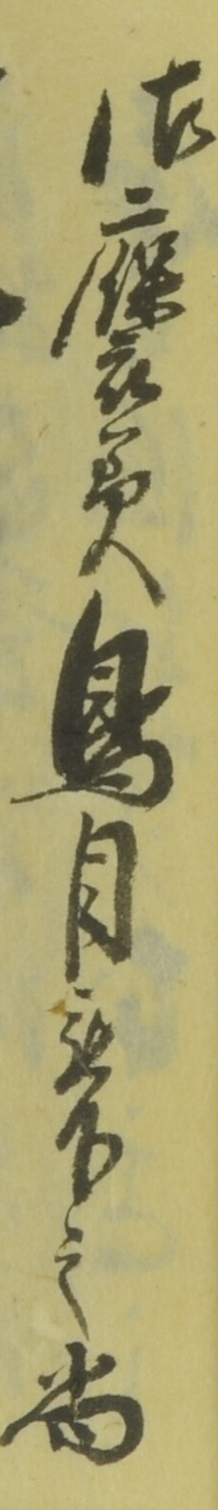御褒美鳥目被下之候

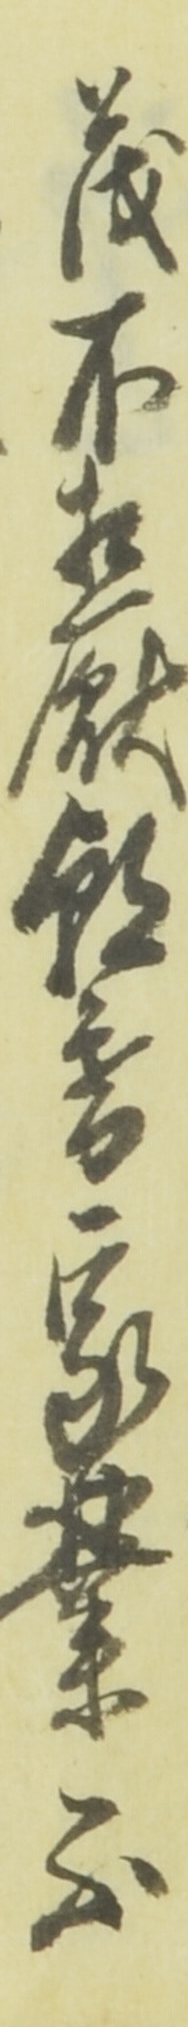も不相厭願書家業不
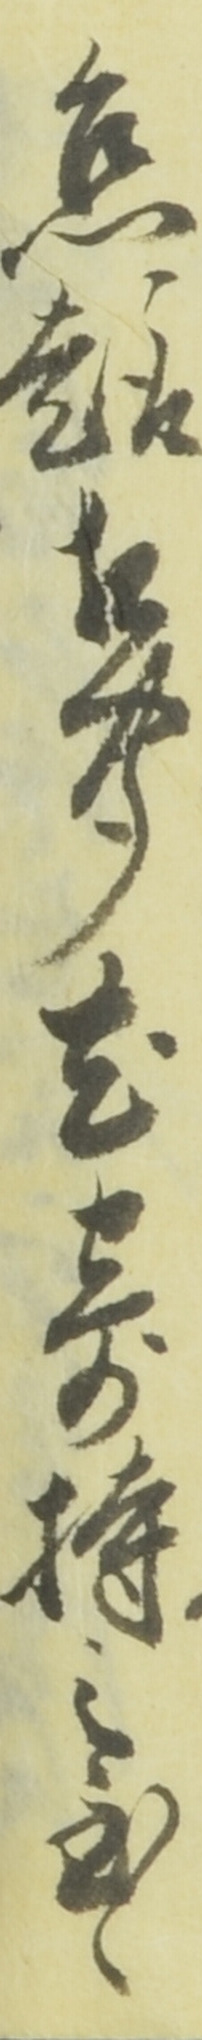怠趣相聞尤奇特之至候
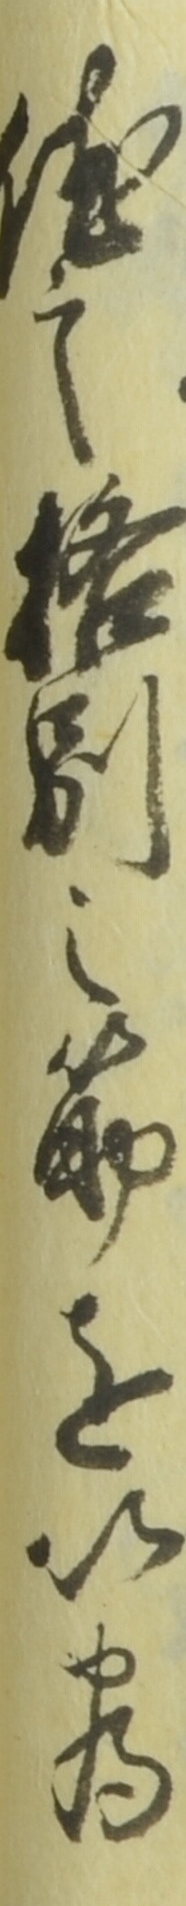依之格別之筋を以為
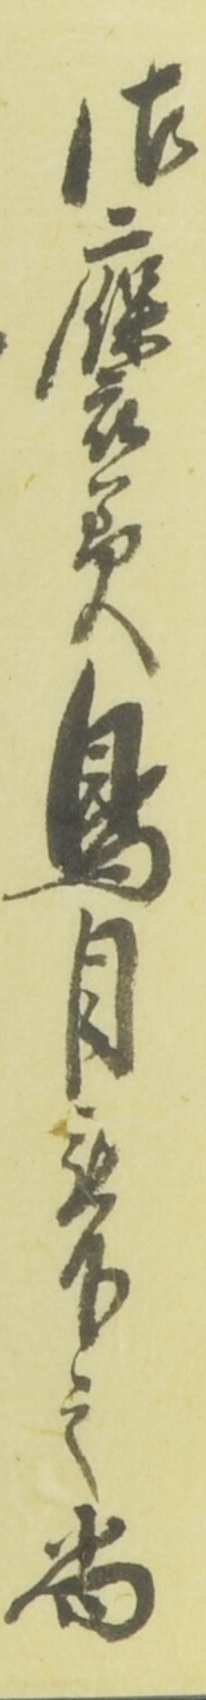御褒美鳥目被下之尚
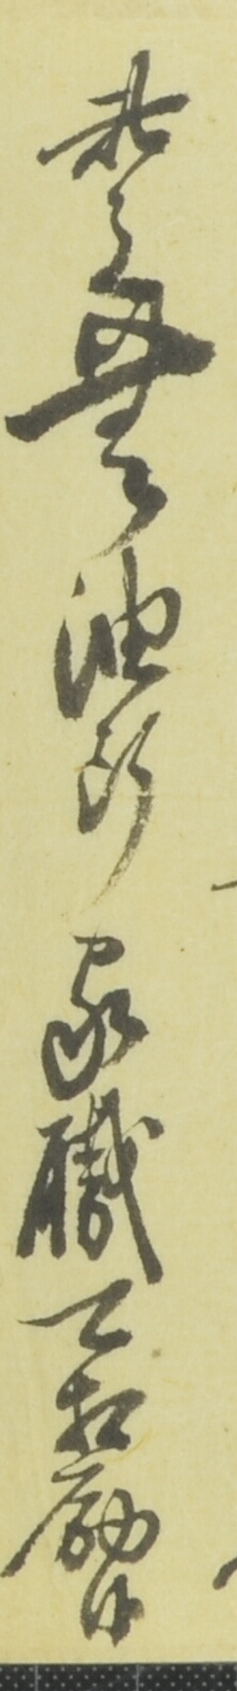此上無油断家職可相励候
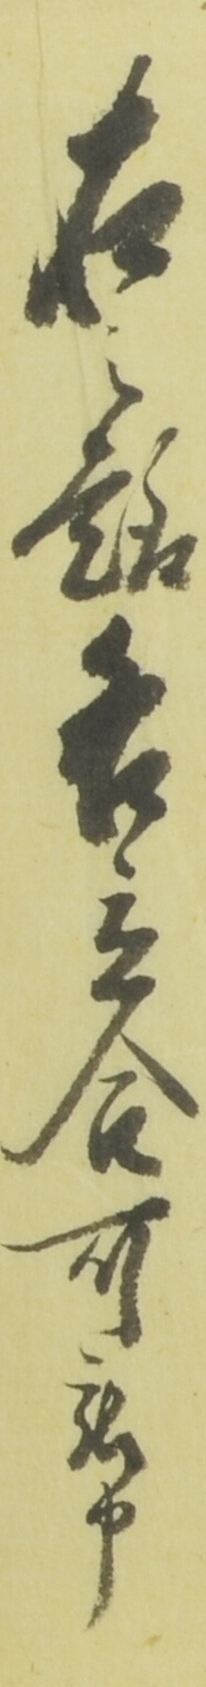右之趣各立合可被申
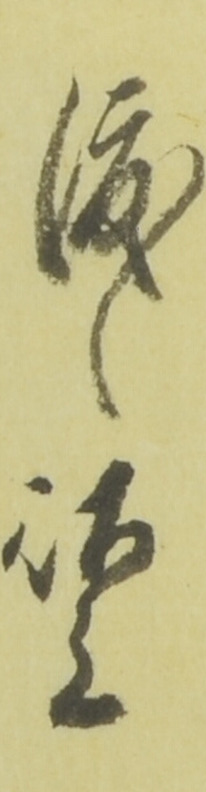渡候以上
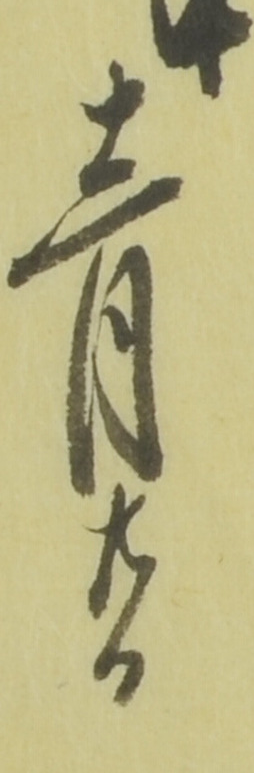十二月廿日
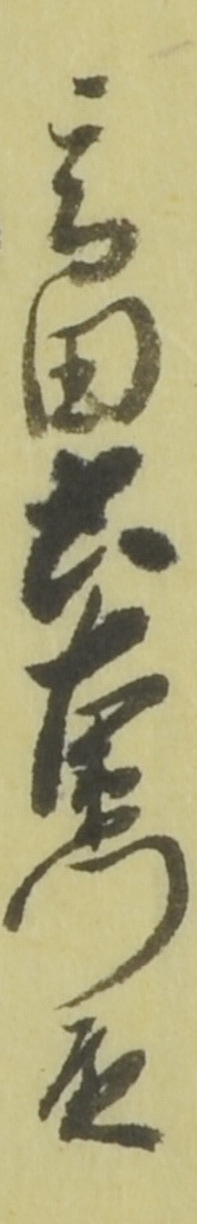高田六右衛門殿
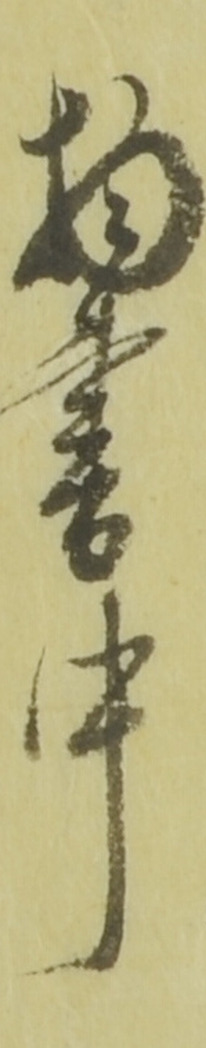物書中
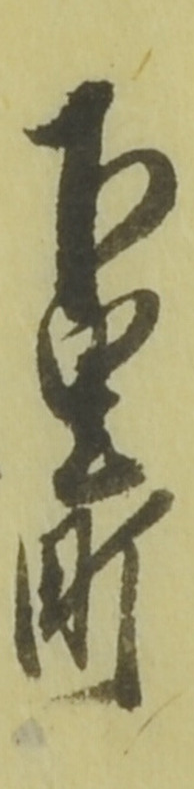下里町
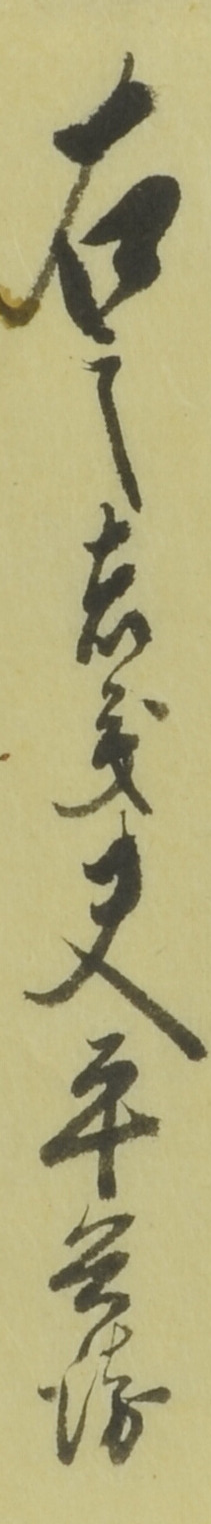右之者義夫平兵衛
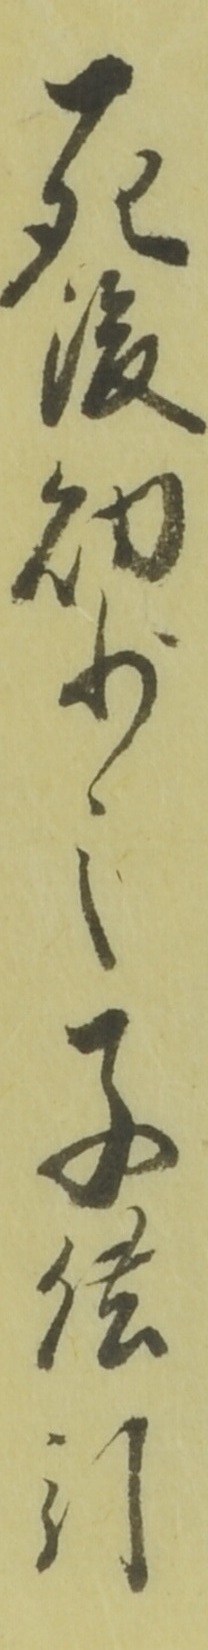死後幼少之子供引
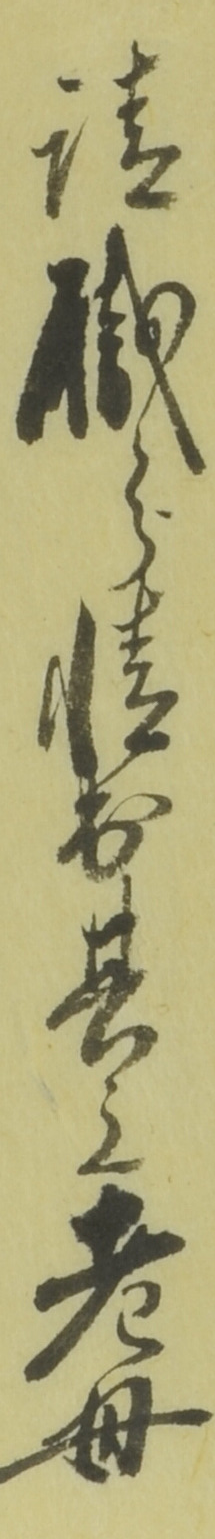請職分情出其上老母
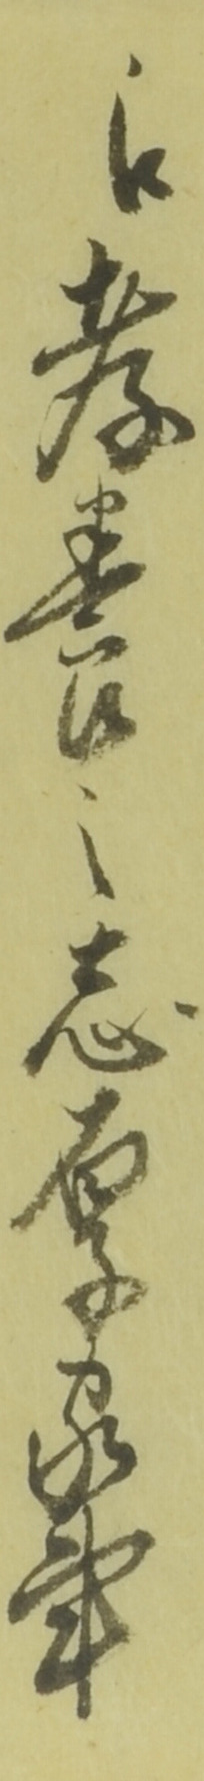江孝養之志厚家事
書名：御触書御書附控
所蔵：伊那市立高遠町図書館・合同会社AMANE
